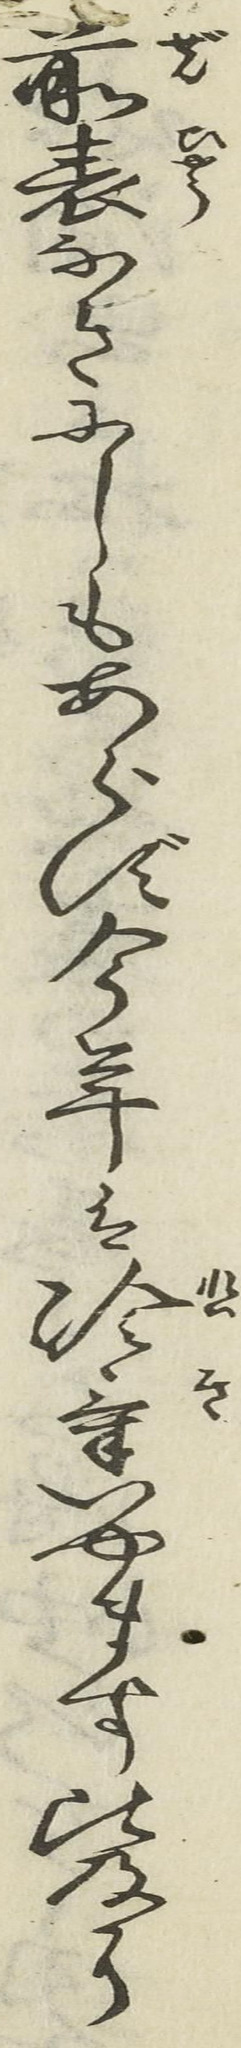前表なきにしもあらず今年は冷気いやますに
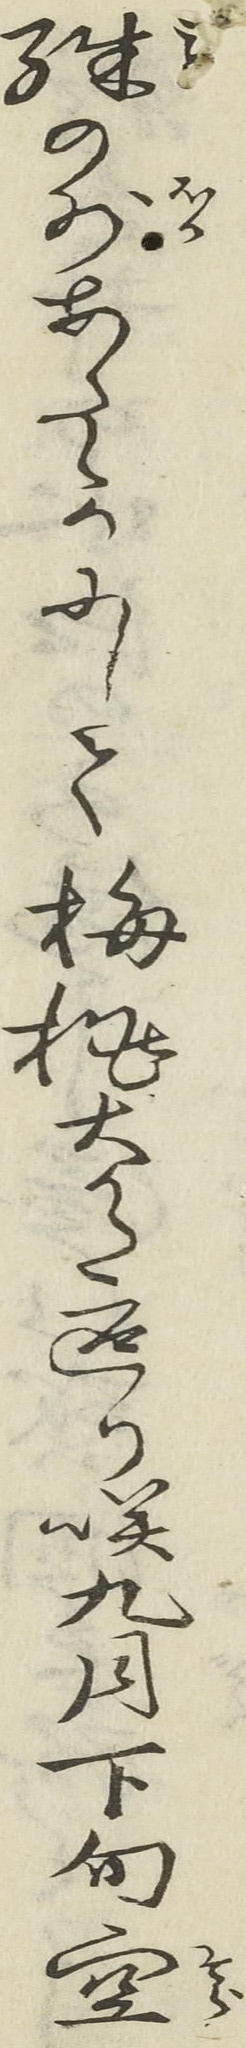殊の外あたゝかにして梅桃大かた返り咲九月下旬空
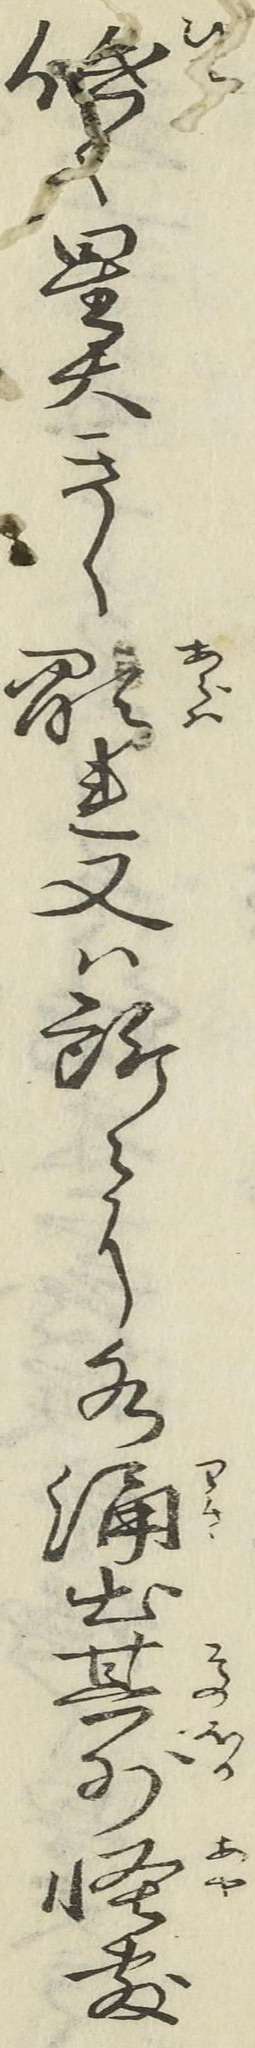低く星大きく顕れ又は所々に水涌出其外怪敷
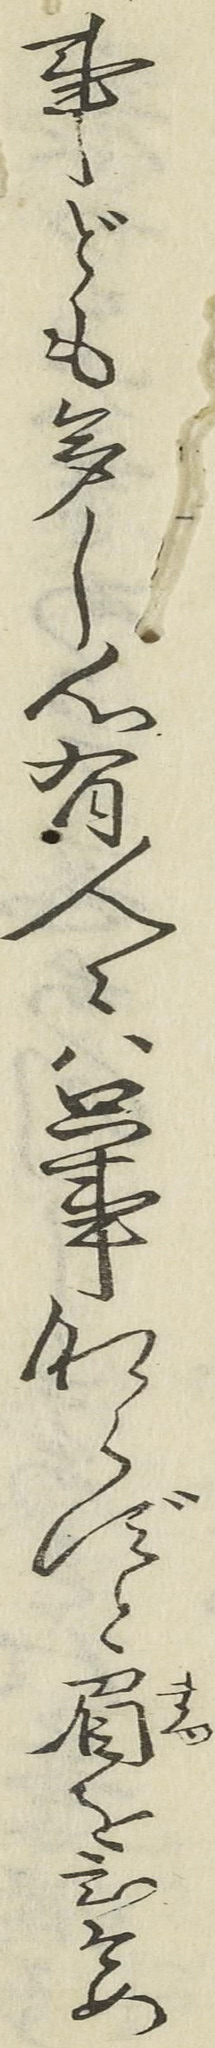事ども多し心有人々は只事ならずと眉をひそめ
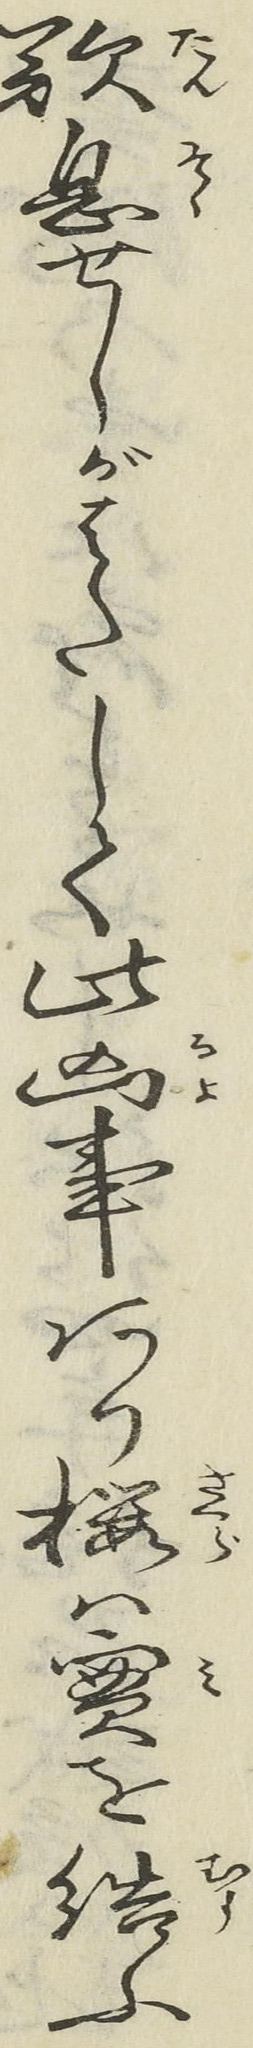歎息せしがはたして此凶事あり桜は實を結ふ
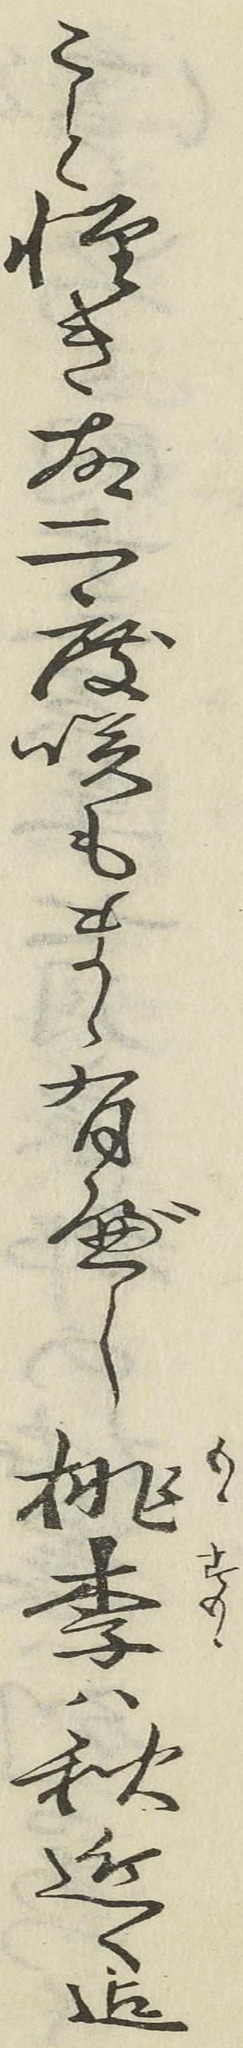こと軽き故二度咲もまゝ有べし桃李は秋近く迄
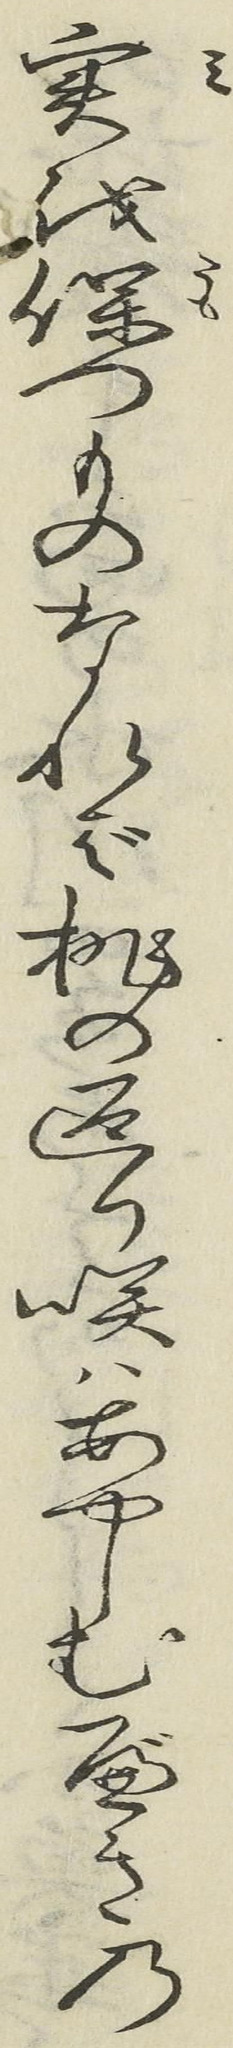実を保つものなれば桃の返り咲はあやしむべきの
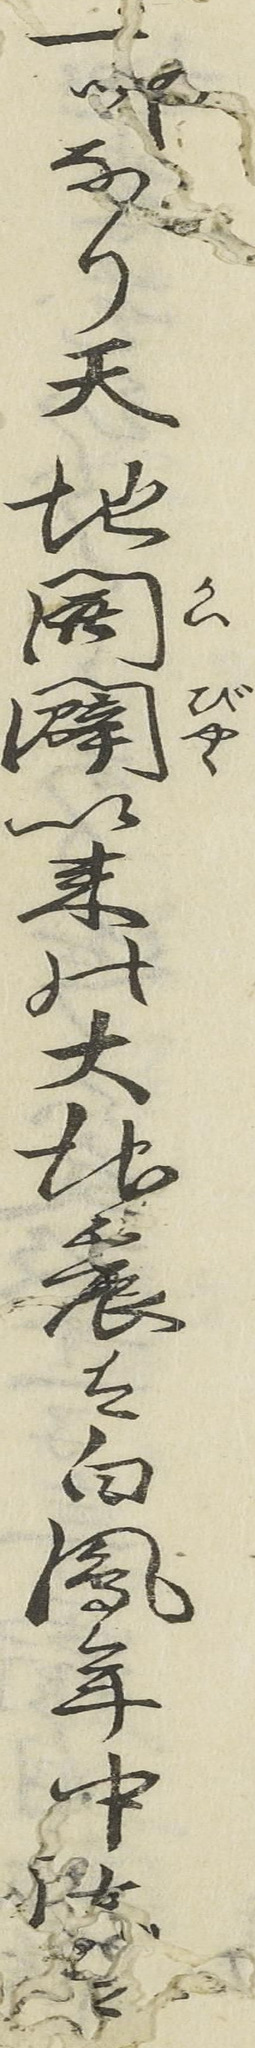一ツなり天地開闢以来の大地震は白鳳年中
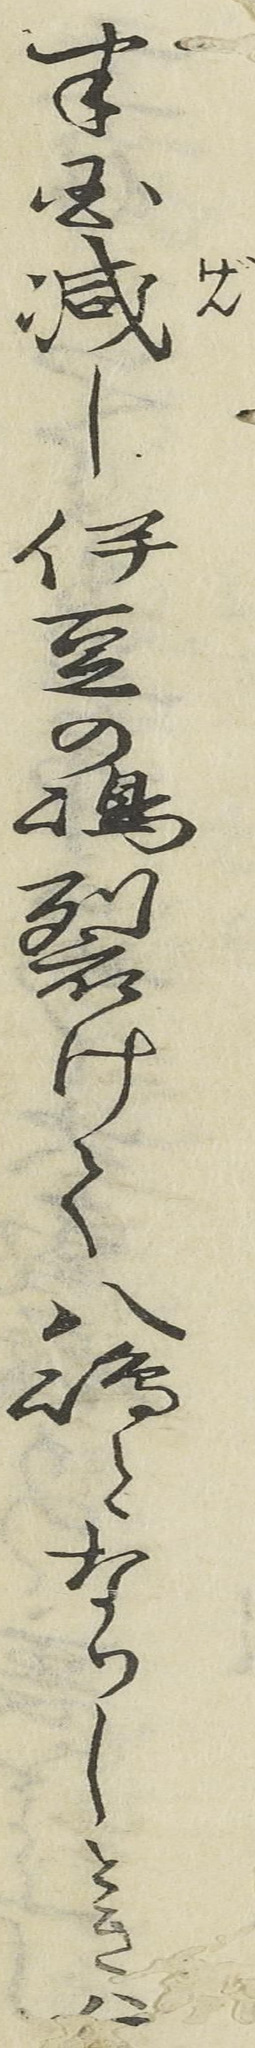半国減し伊豆の嶋裂けて八嶋となりしときは

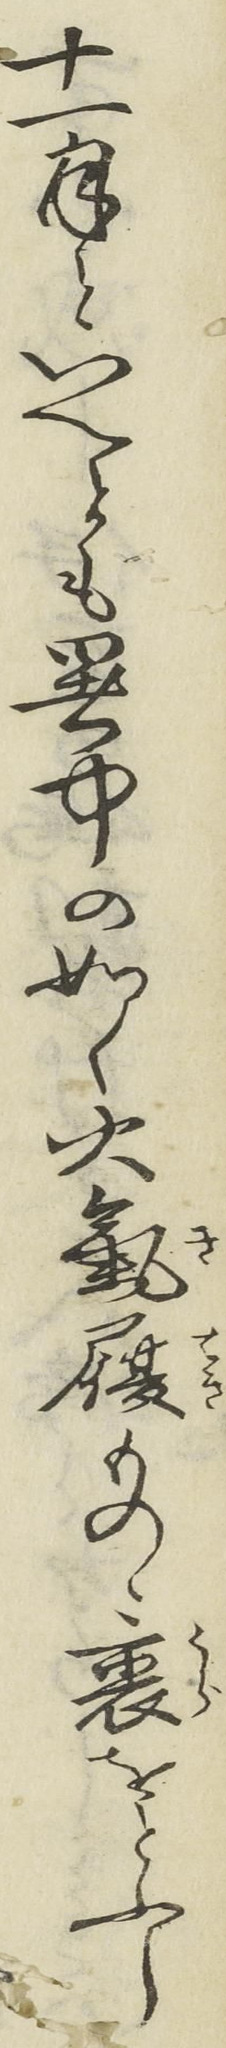十一月といへとも暑中の如く火気履ものゝ裏をとふし
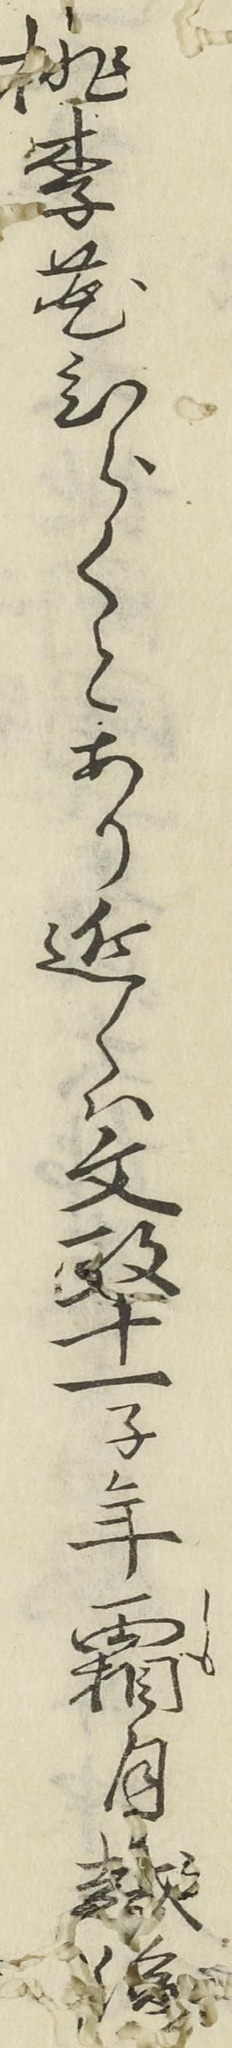桃李花ひらくとあり近くは文政十一子年霜月越後
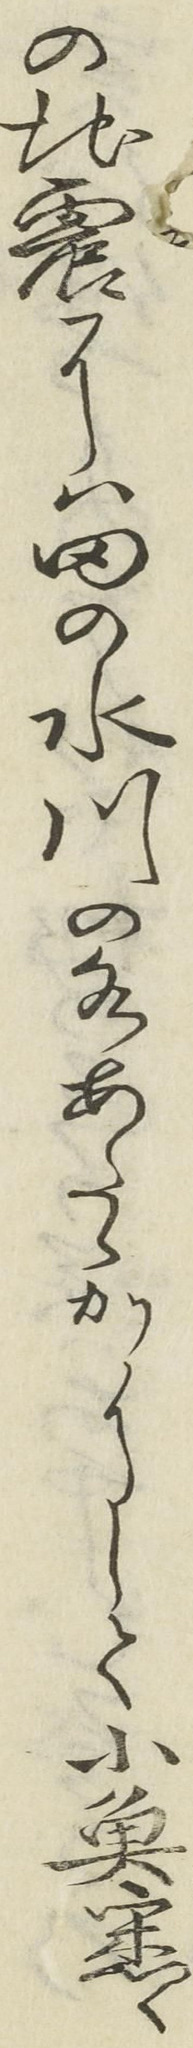の地震には田の水川の水あたゝかにして小魚悉く
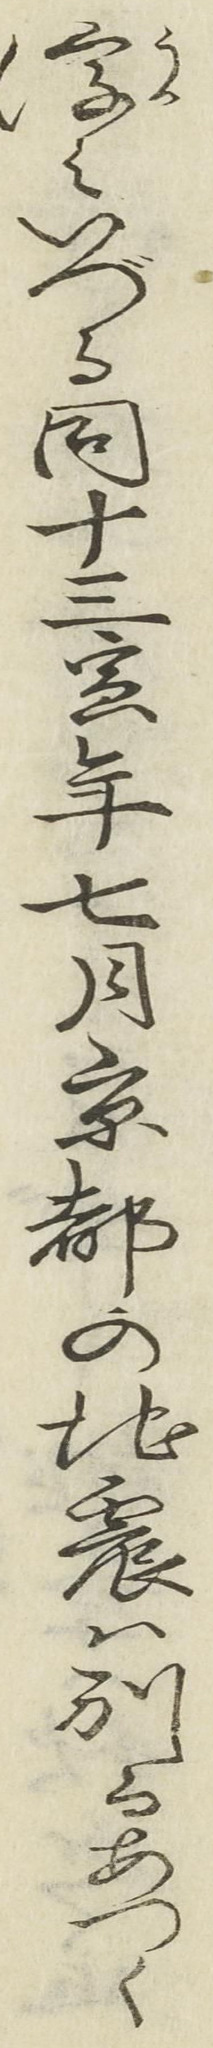浮みいづる同十三寅年七月京都の地震は別而あつく
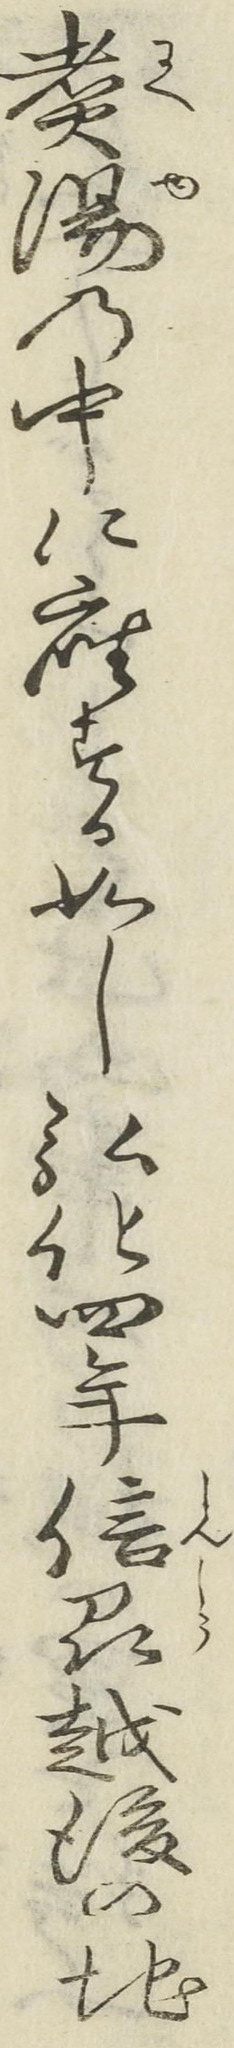煮湯の中に座する如し弘化四年信州越後の地
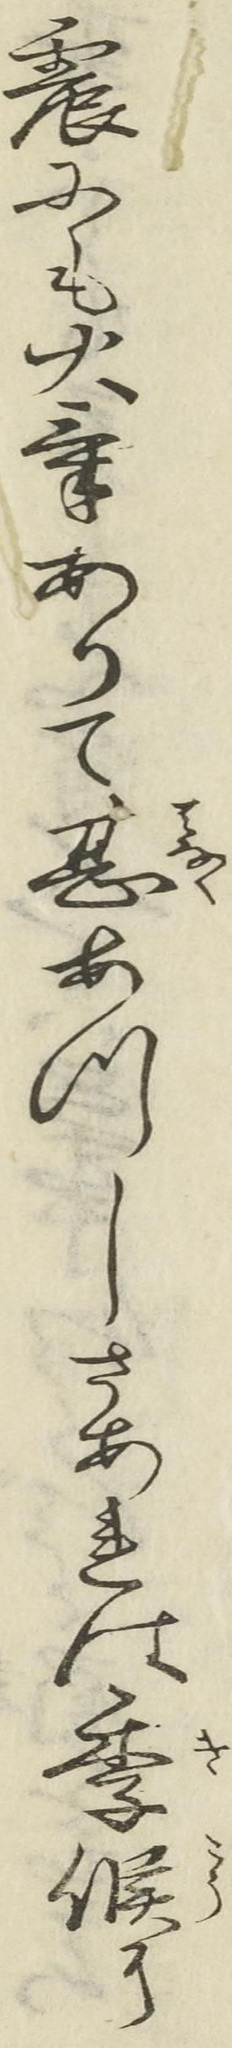震にも火気ありて甚あつしさあれは季候に
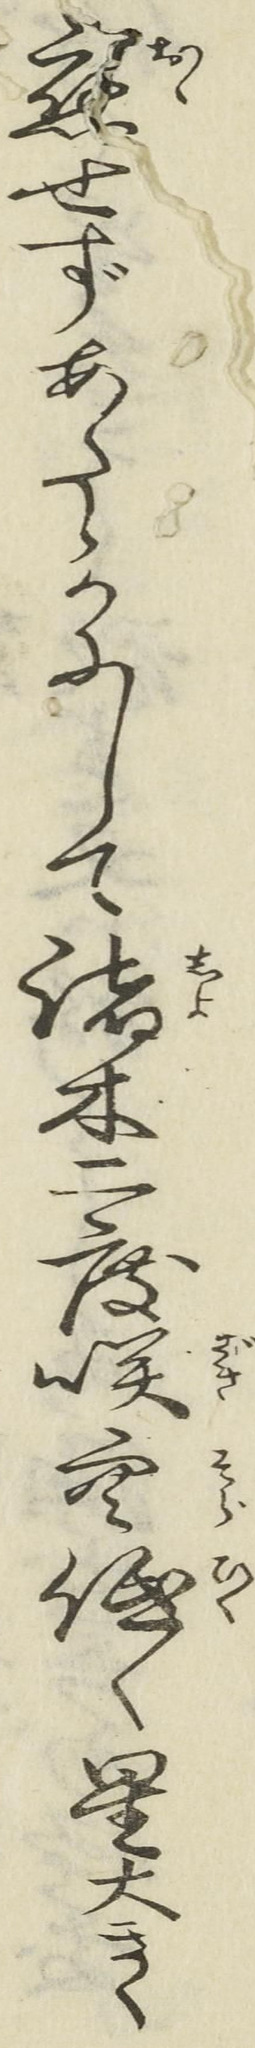応せずあたゝかにして諸木二度咲空低く星大きく
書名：震雷考説　全
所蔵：東京大学地震研究所図書室 Earthquake Research Institute Library, The University of Tokyo, JAPAN
